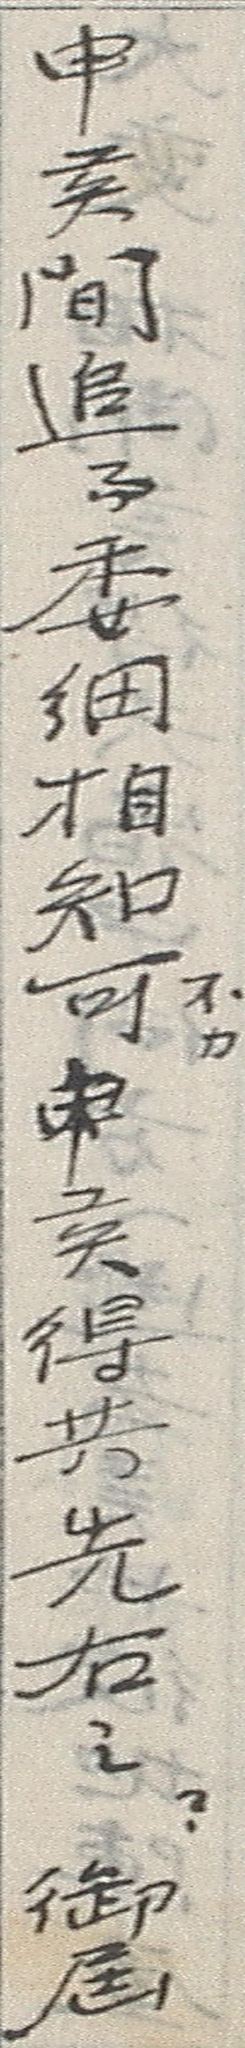申候間追而委細相知可申候得共先右之？御届
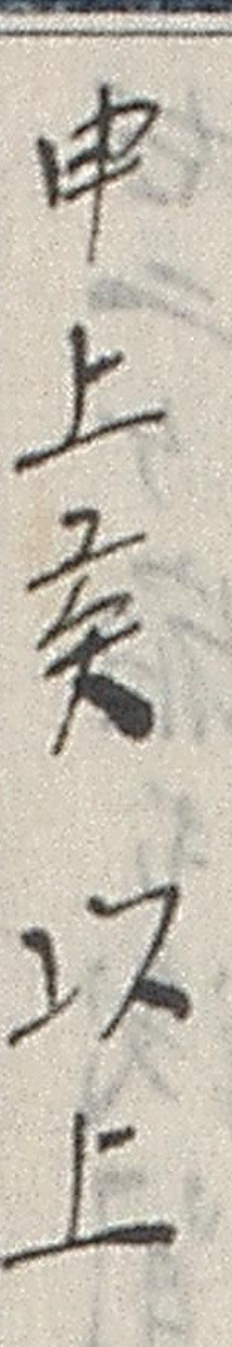申上候以上
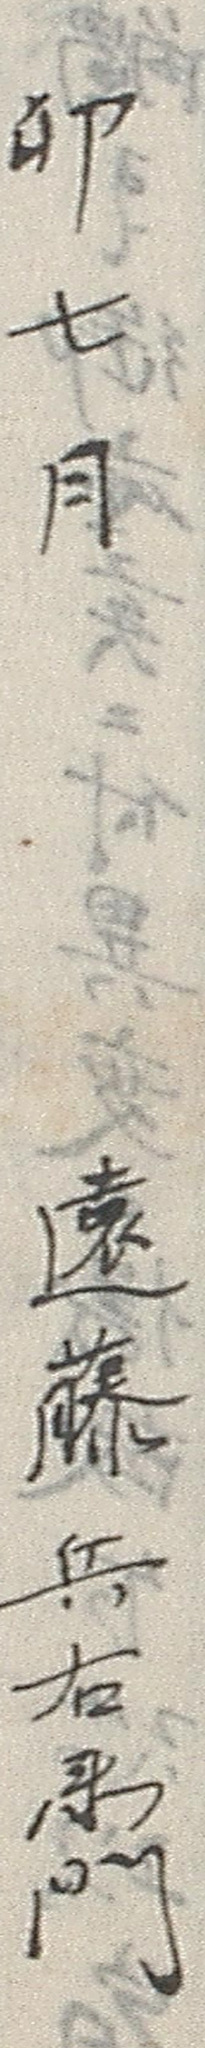卯七月遠藤兵衛右衛門
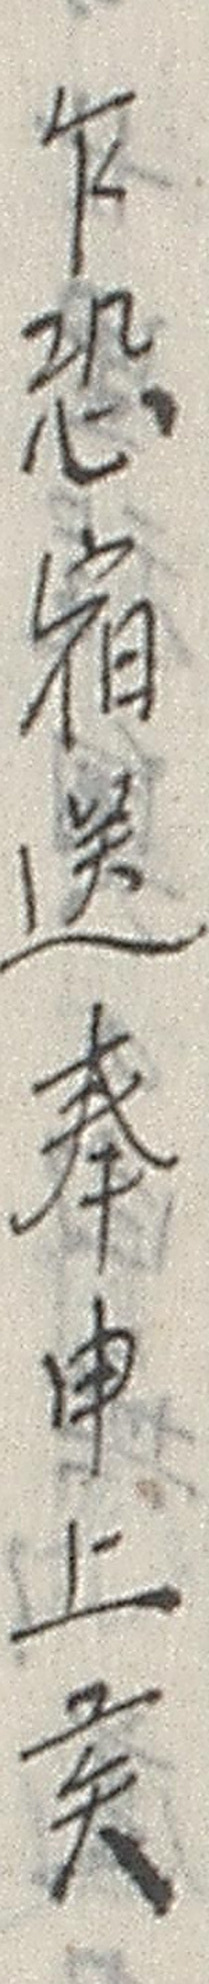乍恐宿送奉申上候
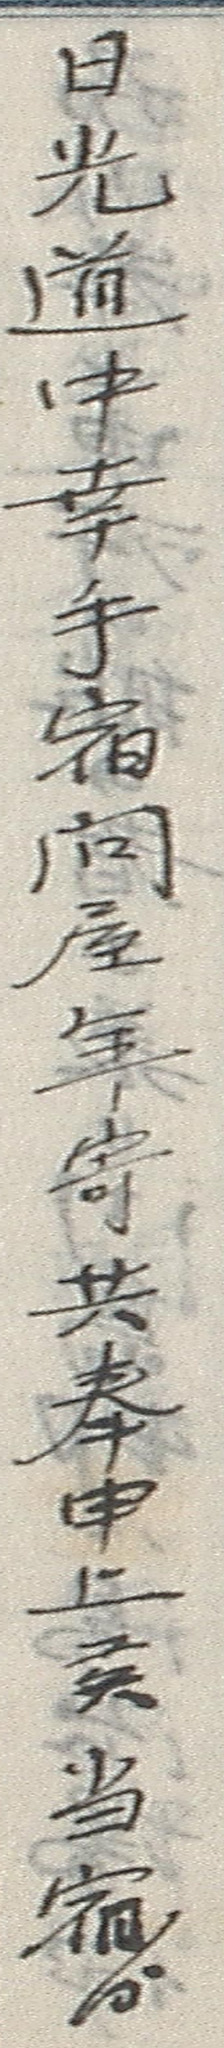日光道中幸手宿問屋年寄共奉申上候当宿ゟ
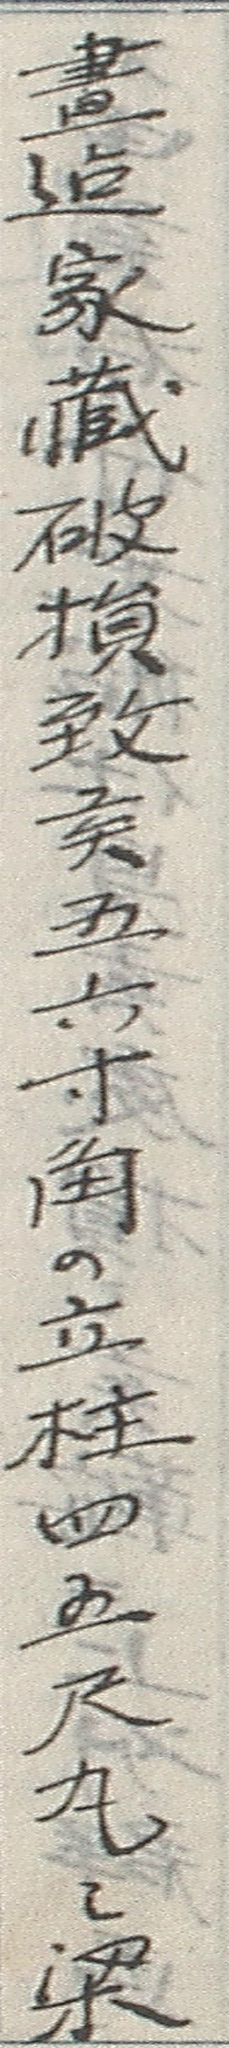昼迄家蔵破損致候五六寸角の立柱四五尺丸之梁
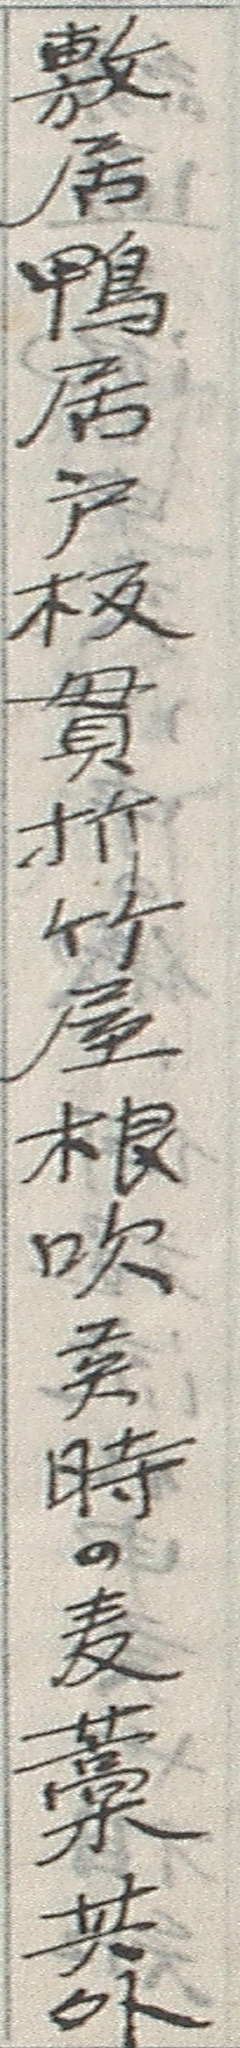敷居鴨居戸板貫折竹屋根吹候時の麦藁其外
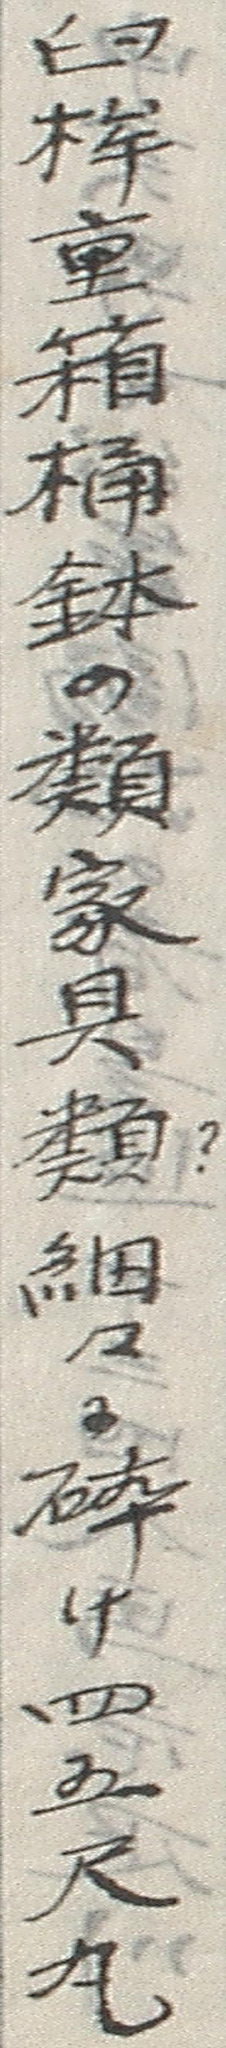臼杵重箱桶鉢の類家具類細々に砕け四五尺丸
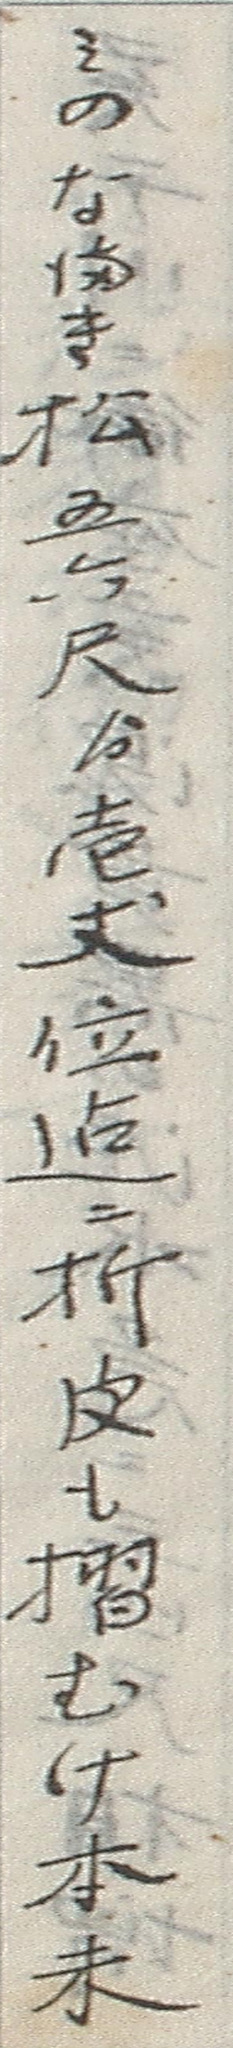ミのなまき松五六尺ゟ壱丈位迄二折皮も摺むけ本末
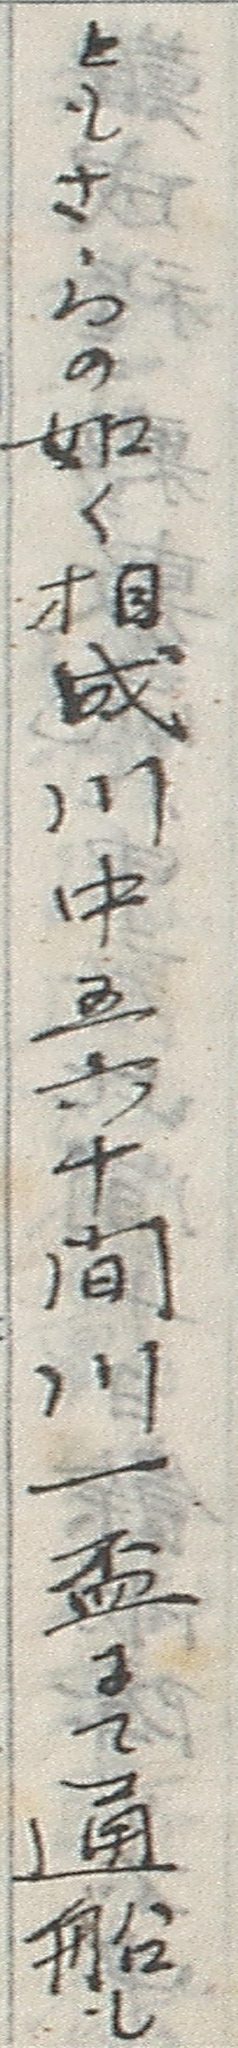ともさゝらの如く相成川中五六十間川一盃まで通船も

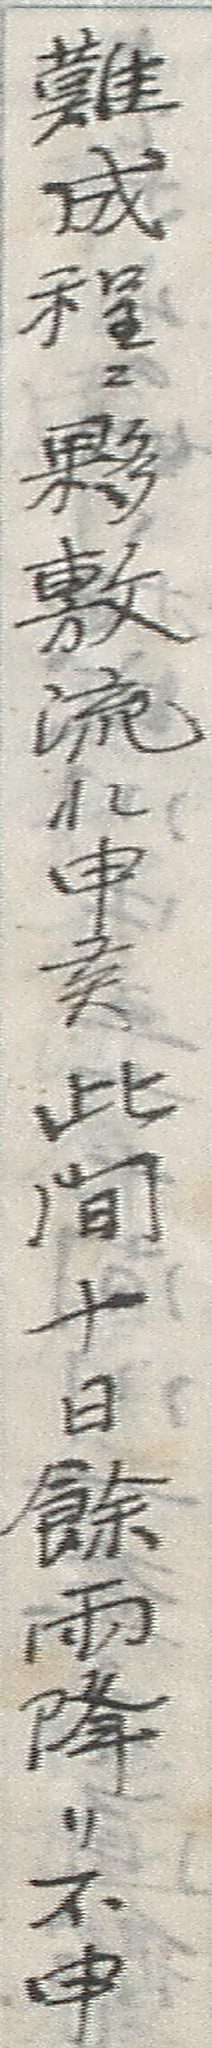難成程ニ夥敷流れ申候此間十日餘雨降り不申
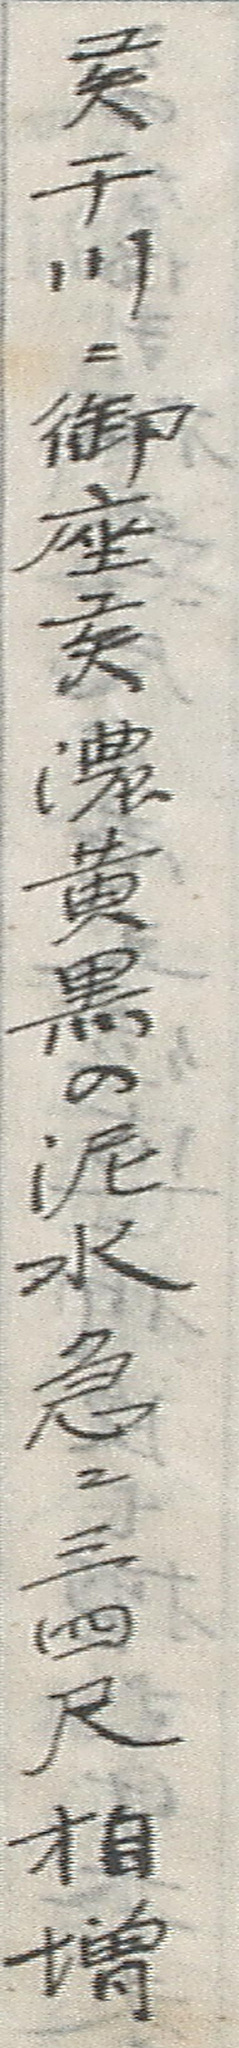候干川ニ御座候濃黄黒の泥水急二三四尺相増
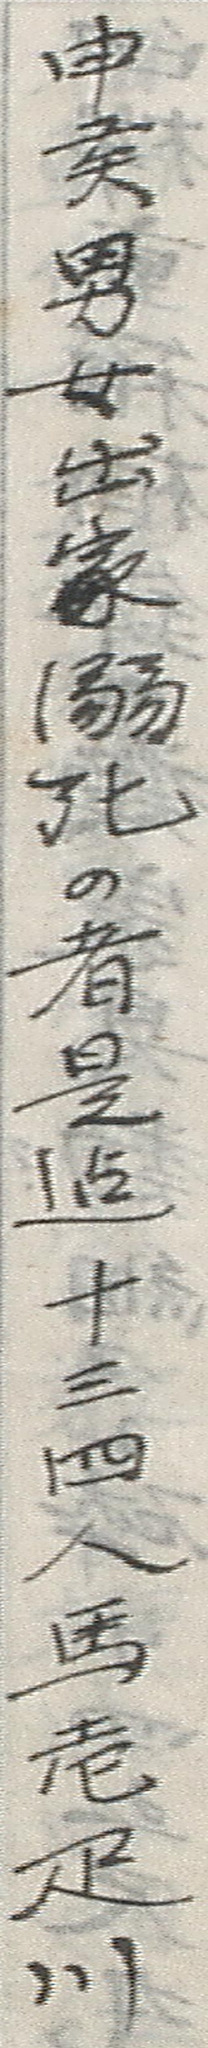申候男女出家溺死の者是迠十三四人馬壱疋川
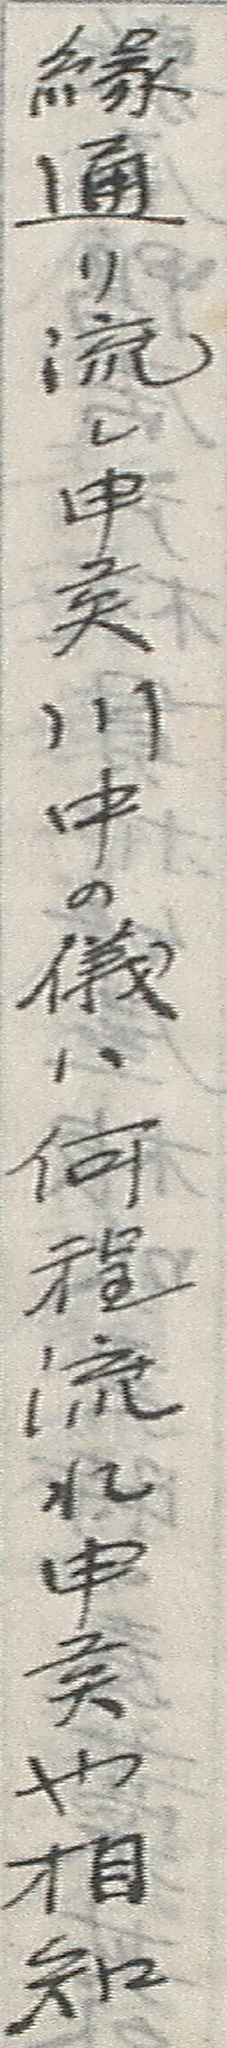縁通り流ㇾ申候川中の儀ハ何程流れ申候や相知
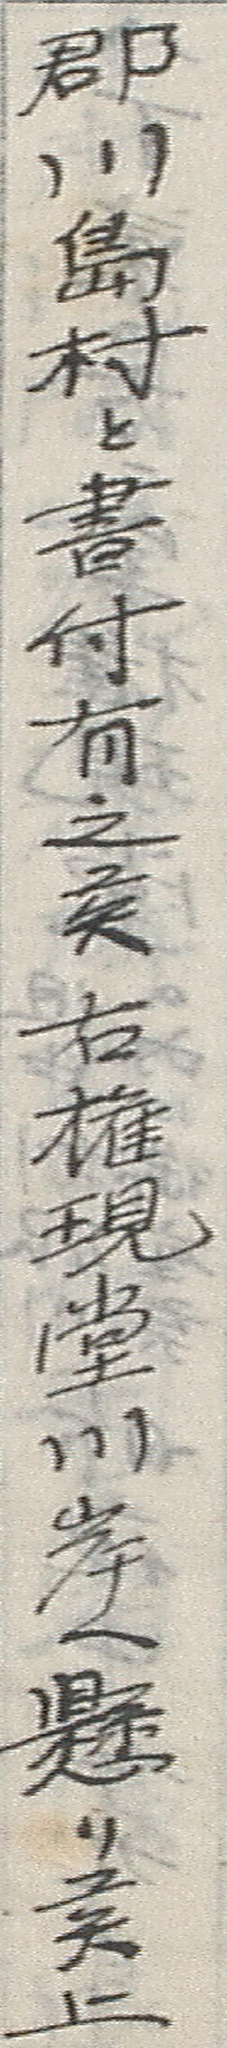郡川島村と書付有之候右権現堂川岸へ懸り候上
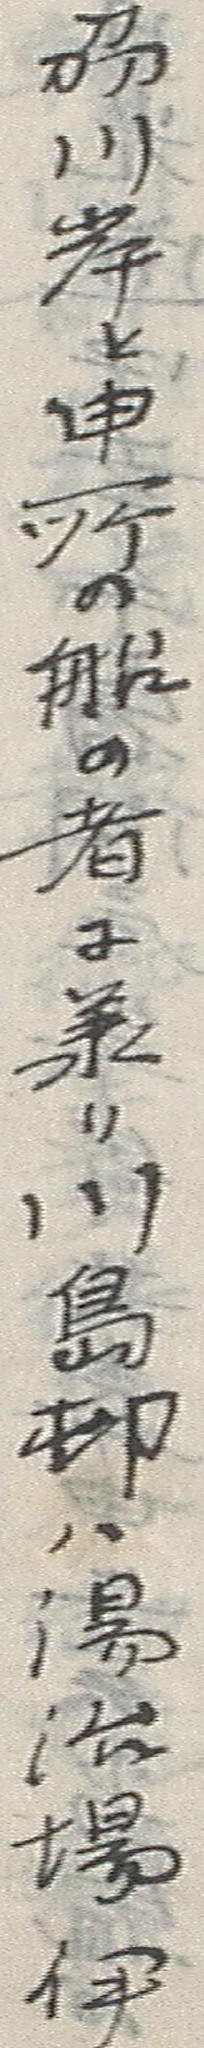州川岸と申所の船の者に承り川島邨ハ湯治場伊
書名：浅間山焼出記
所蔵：東京大学地震研究所図書室 Earthquake Research Institute Library, The University of Tokyo, JAPAN
